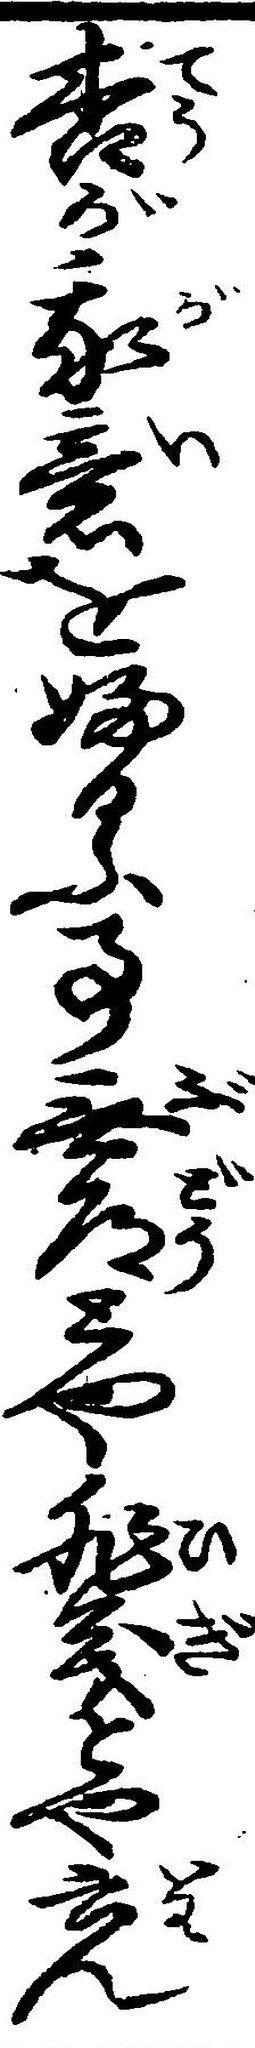杏が我意をふるふ事無道とや非義とや云ん

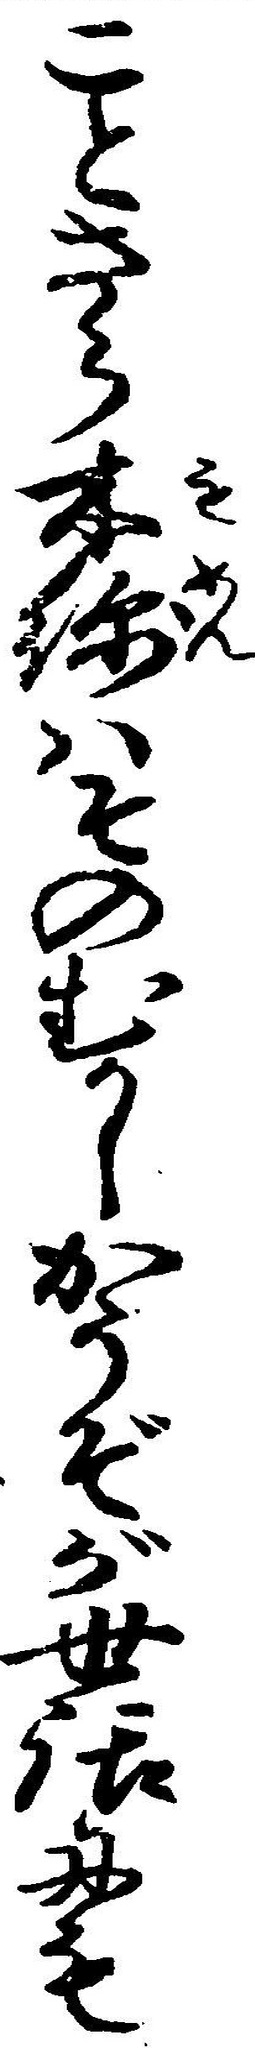ことさら木綿はそのむかしかうぞが世話も
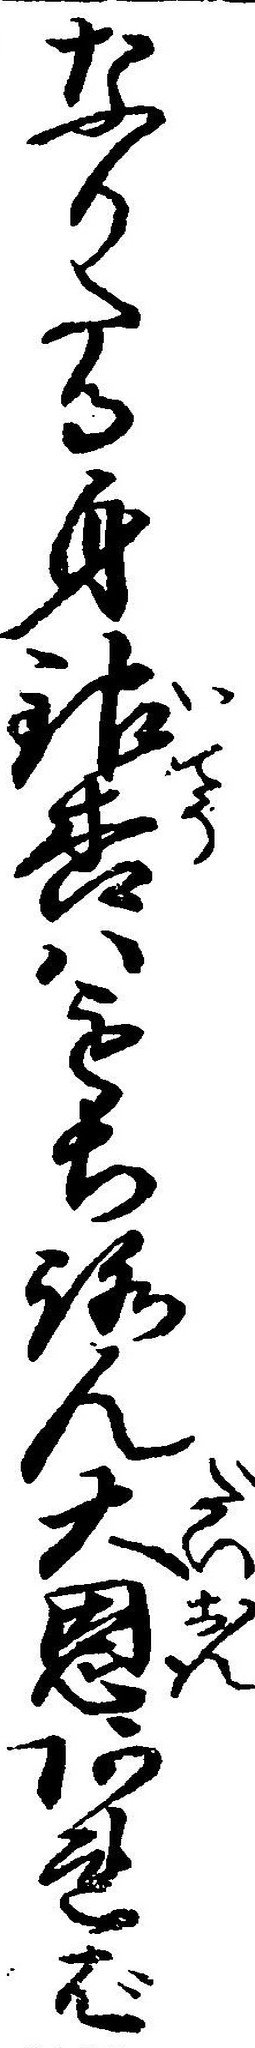なりたる身銀杏はもちろん大恩あれば
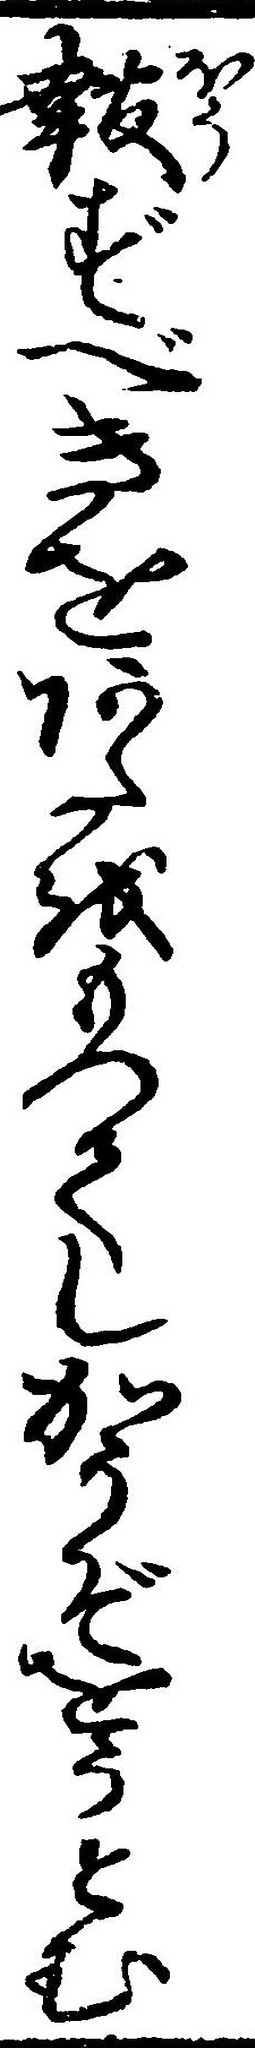報ずべきをあたをもつくしかうぞをうとむ
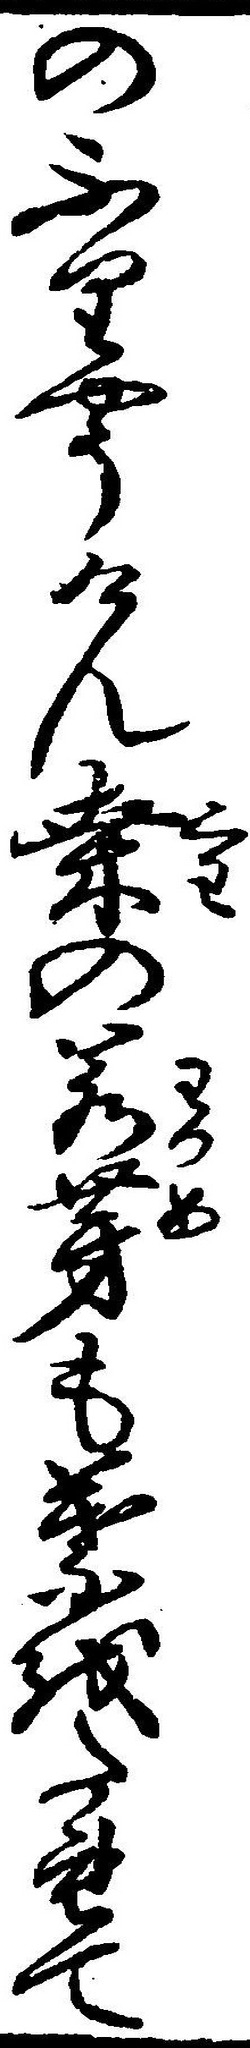のふりやうけん桑の若芽も葉をたれて
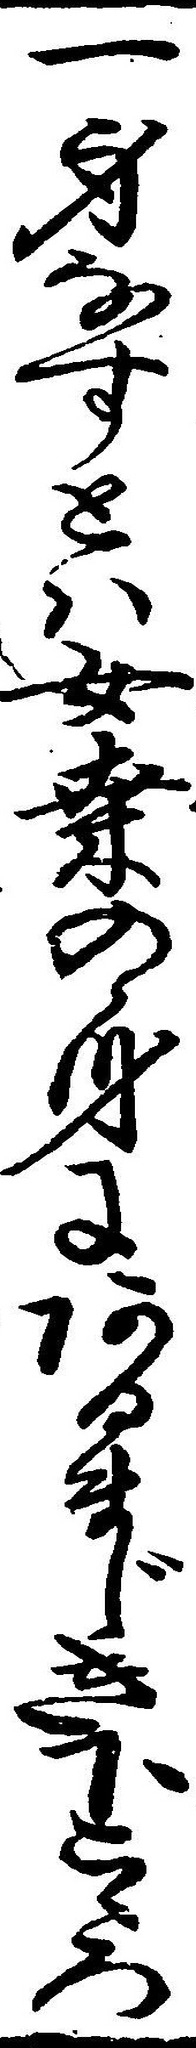一身なすとは女桑の身にあるまじき下こゝろ
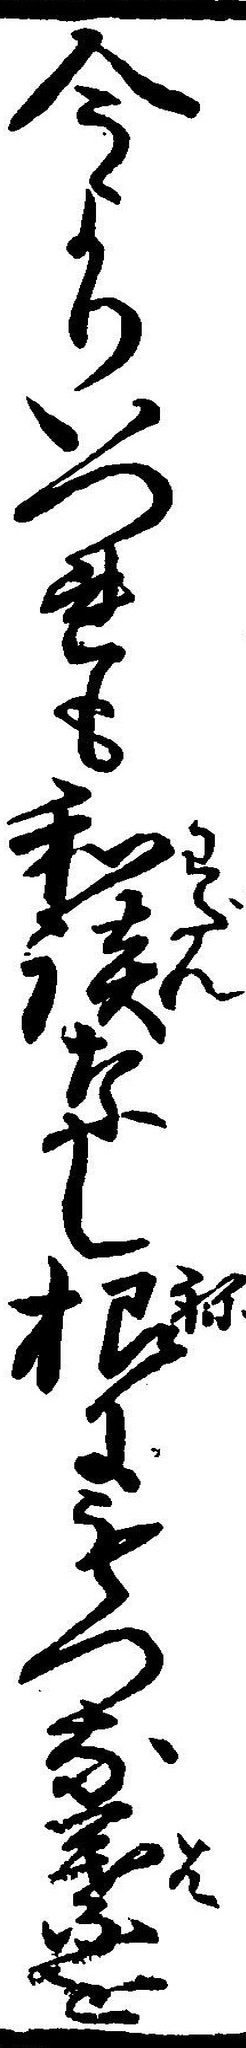今よりいつれも和談なし根にもつな葉を
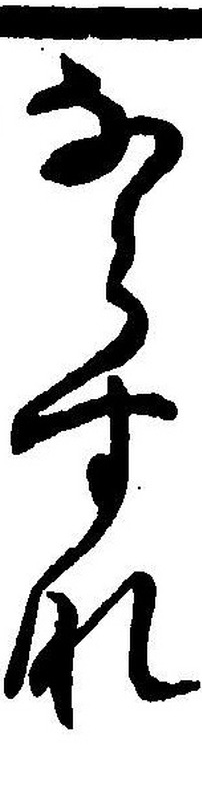ならすな
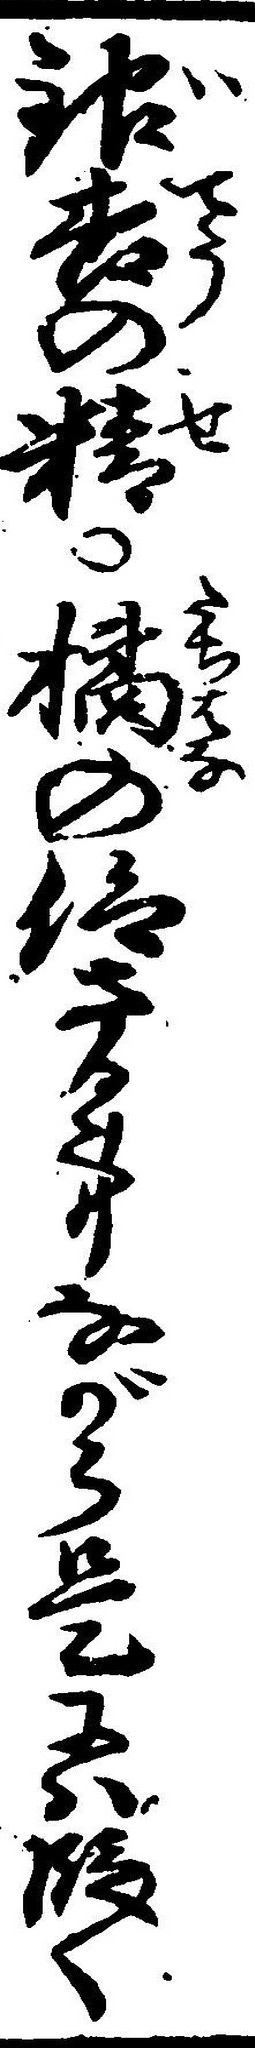銀杏の精○橘の仰さる事ながら是には段〳〵
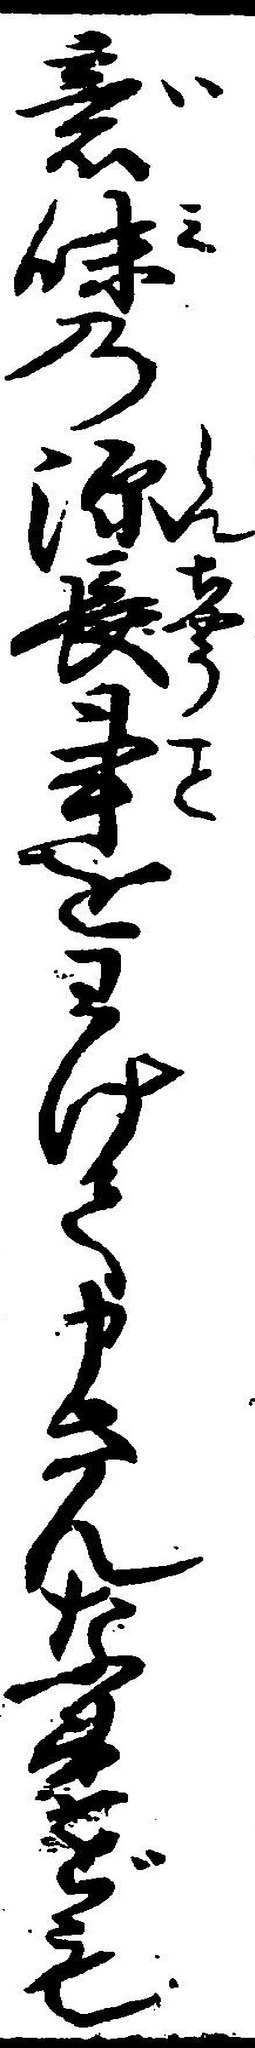意味の深長事をわけて申さんなれども
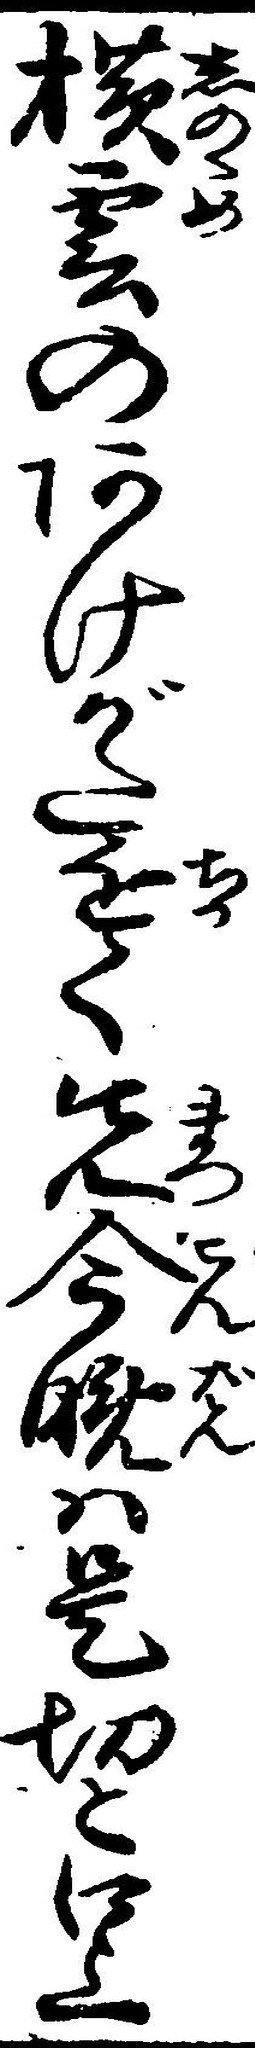横雲のあけがた近く先今晩は是切と口上
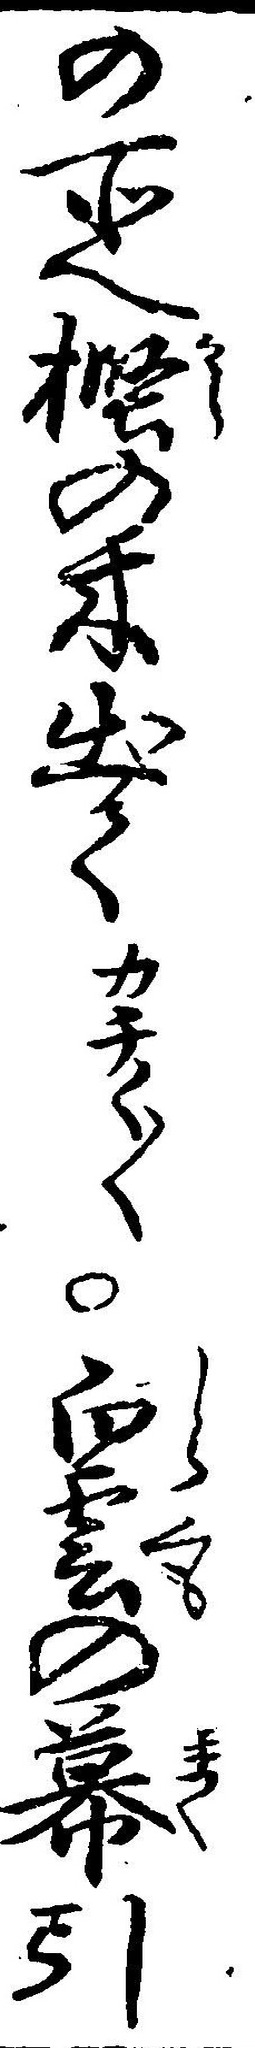の所へ樫の木出てカチ〳〵〳〵○白雲の幕引
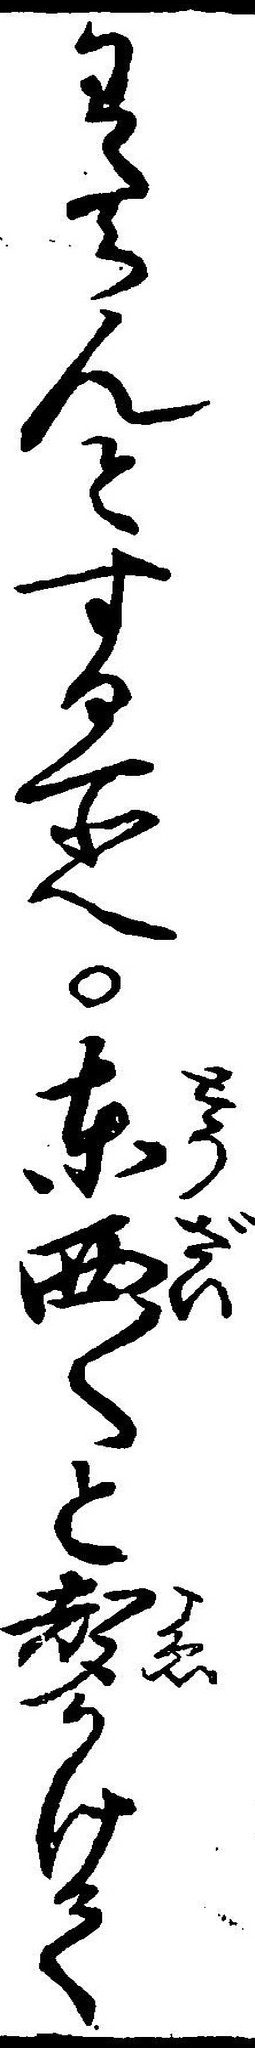わたらんとする所へ○東西〳〵声かけて
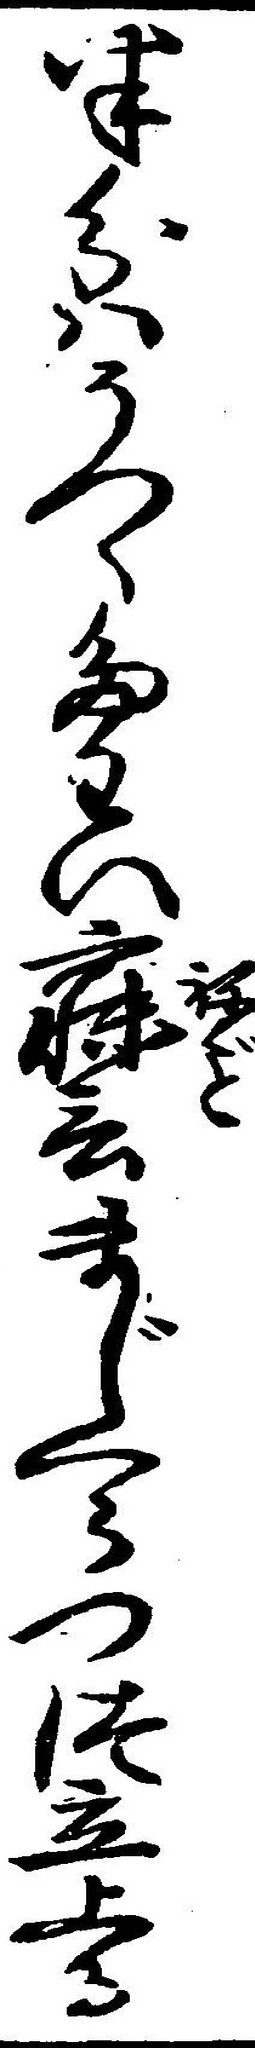半分はうつゝたわい寝言まじへうつつ立上る
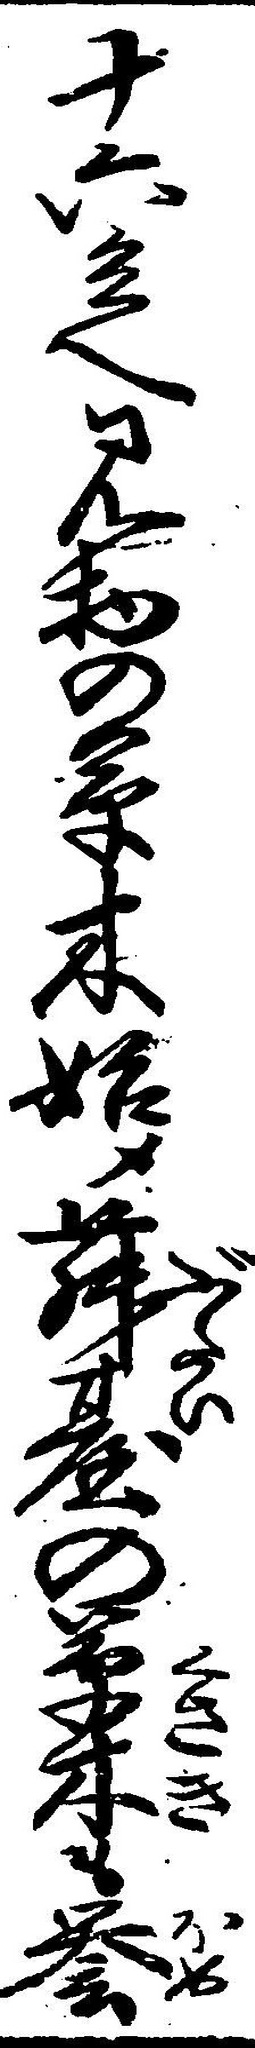十六兵衛見物の草木始舞台の草木も誉

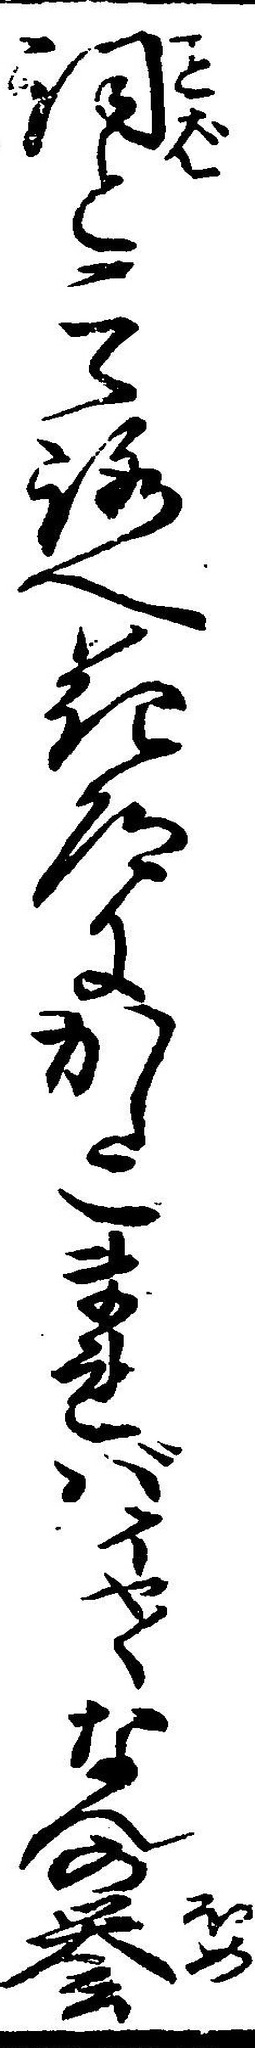詞とこゝろへ花道にかしこまればイヤ〳〵なんの誉
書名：草木芝居化物退治 / 泉花堂三蝶(十六兵衛)作
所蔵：東京大学総合図書館 General Library in the University of Tokyo, JAPAN
